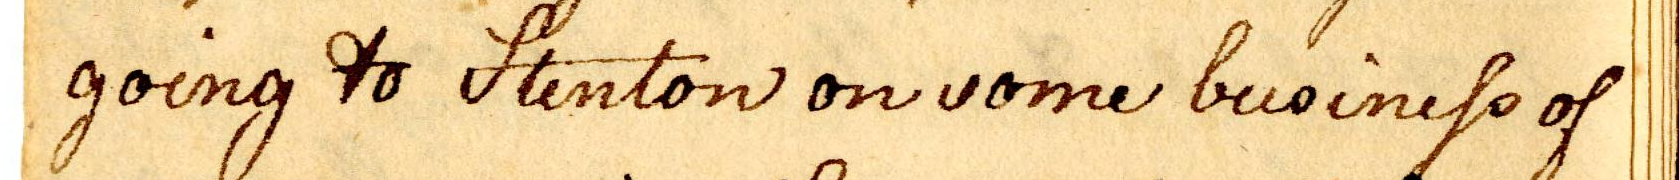going to Stenton on some business of
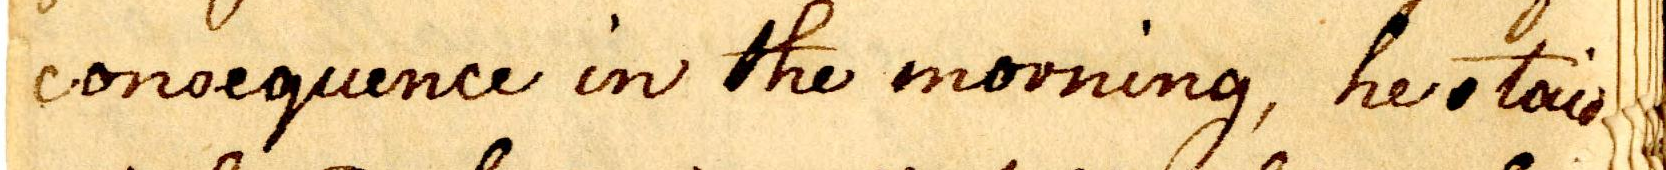consequence in the morning, he staid
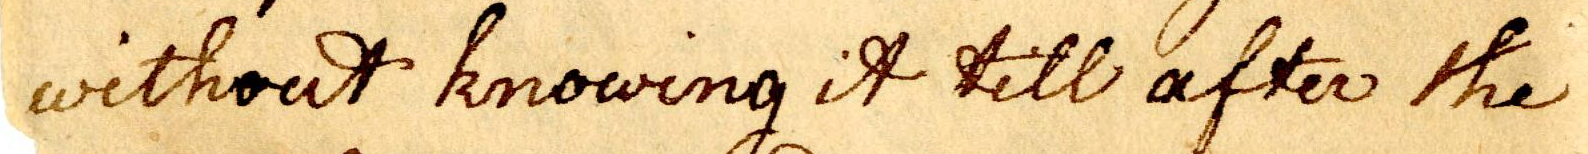without knowing it till after the
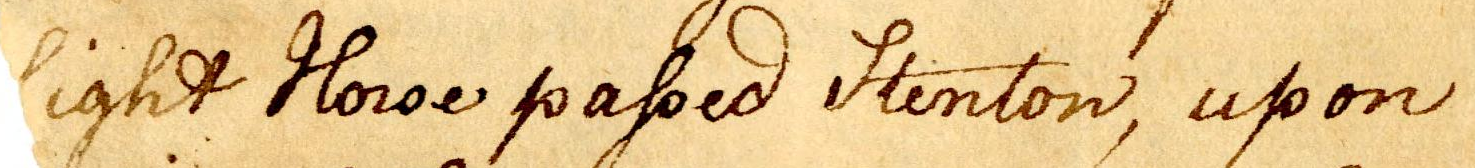Light Horse passed Stenton, upon
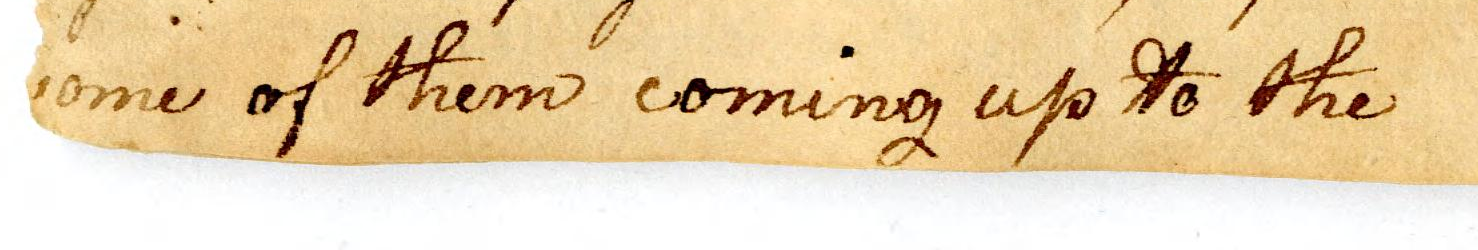some of them coming up to the
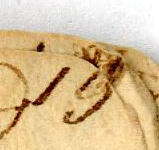19
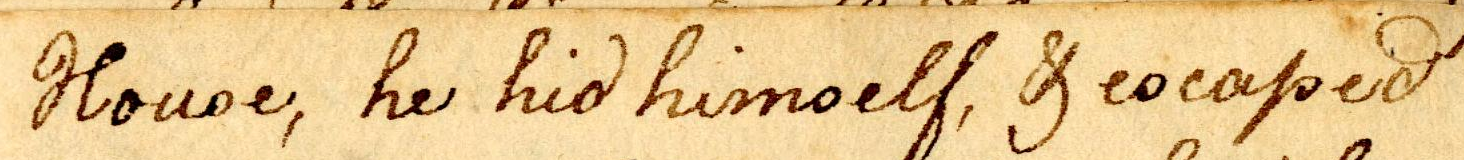House, he hid himself, & escaped
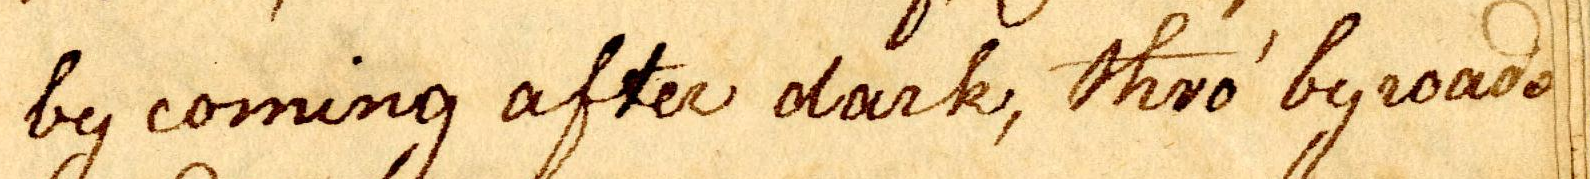by coming after dark, thro' by roads
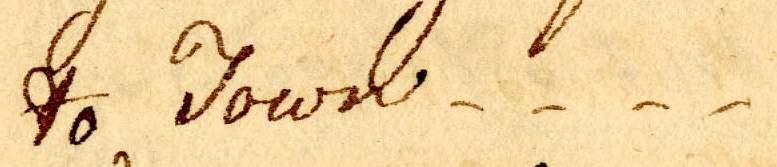to Town----
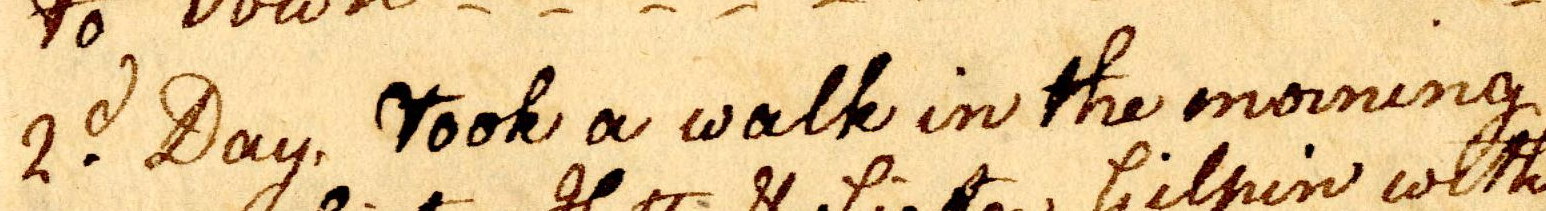2^d. Day, took a walk in the morning
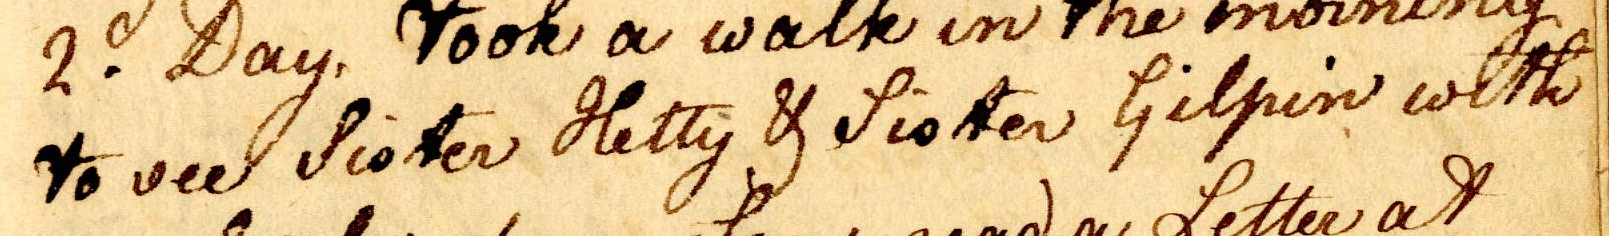to see Sister Hetty & Sister Gilpin with
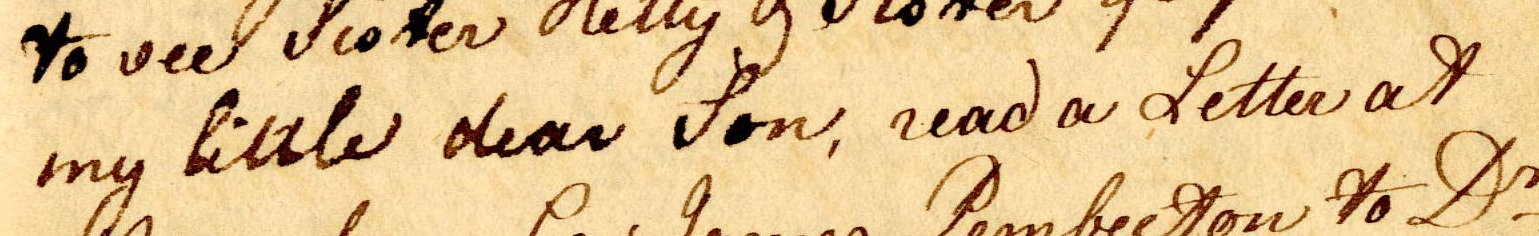my little dear Son, read a Letter at
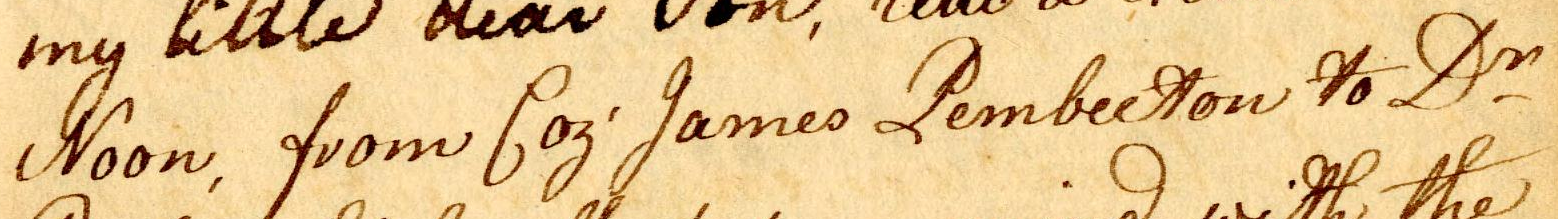Noon, from Coz James Pemberton to D^r
